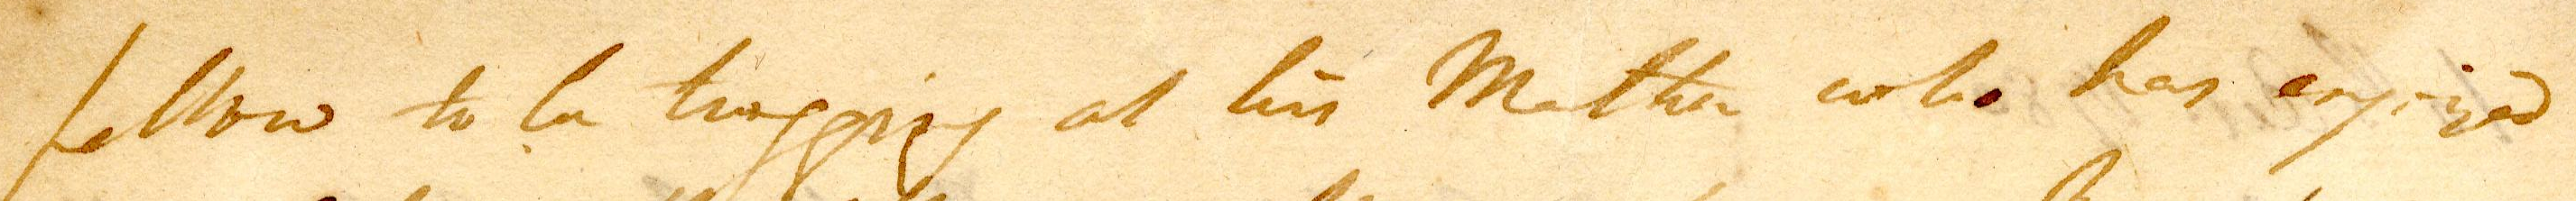fellow to be tugging at his Mother who has aprized
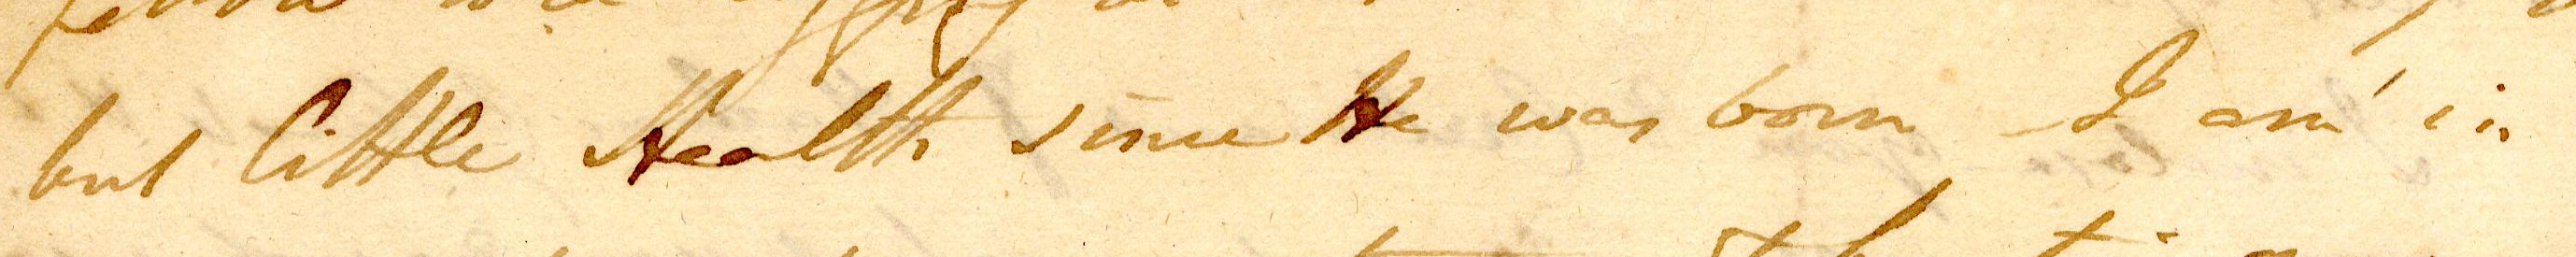but little Health since He was born. I am in
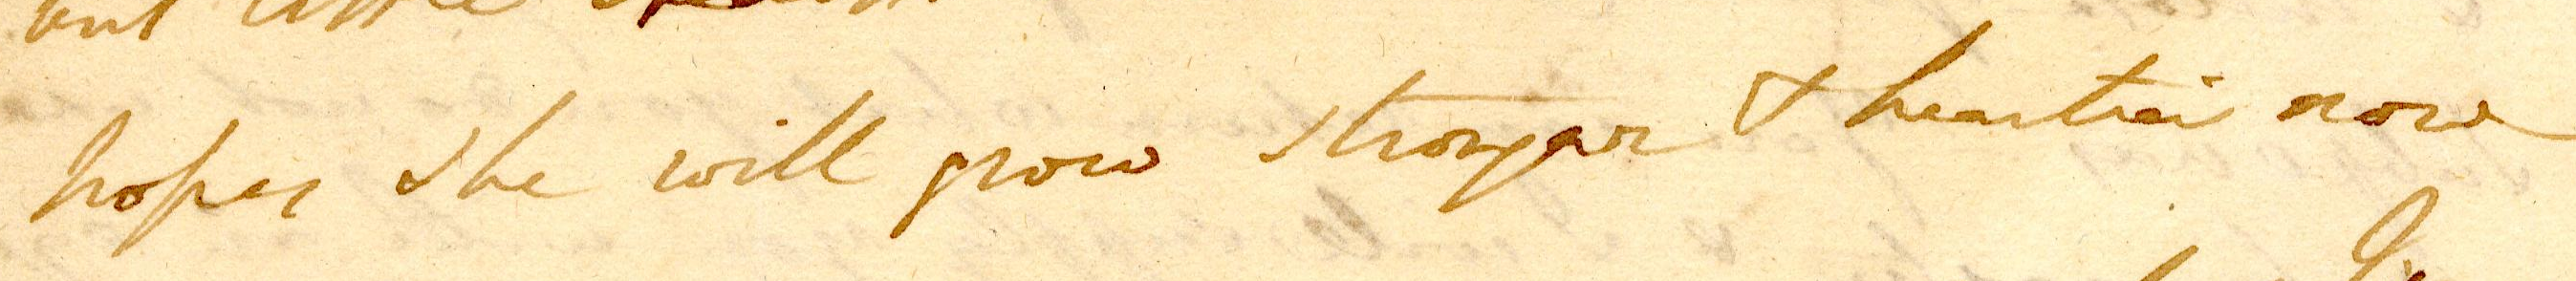hopes she will grow stronger & heartier now
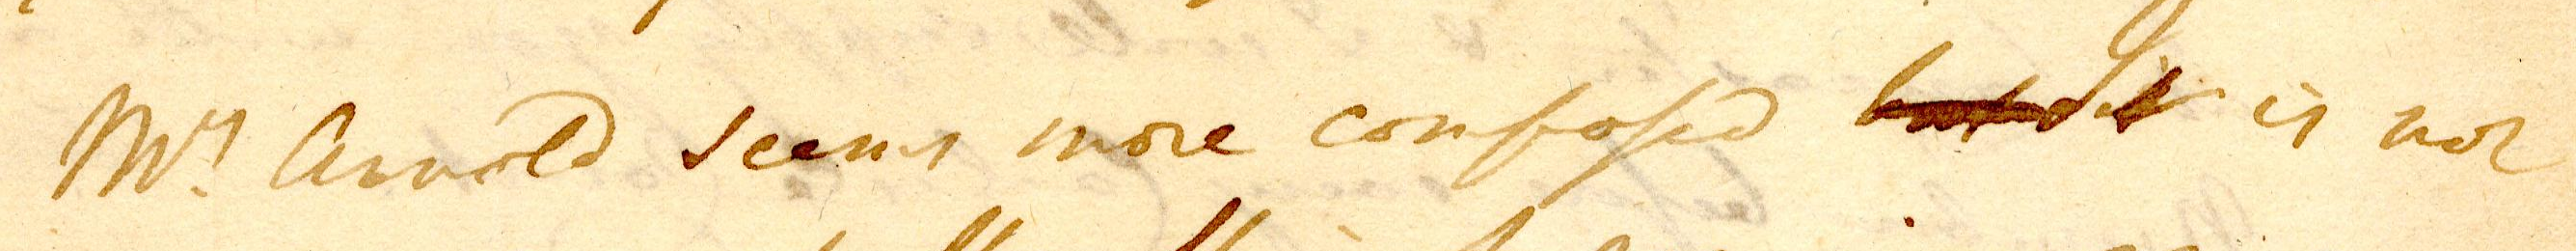M^rs. Arnold seems more confused but It is not
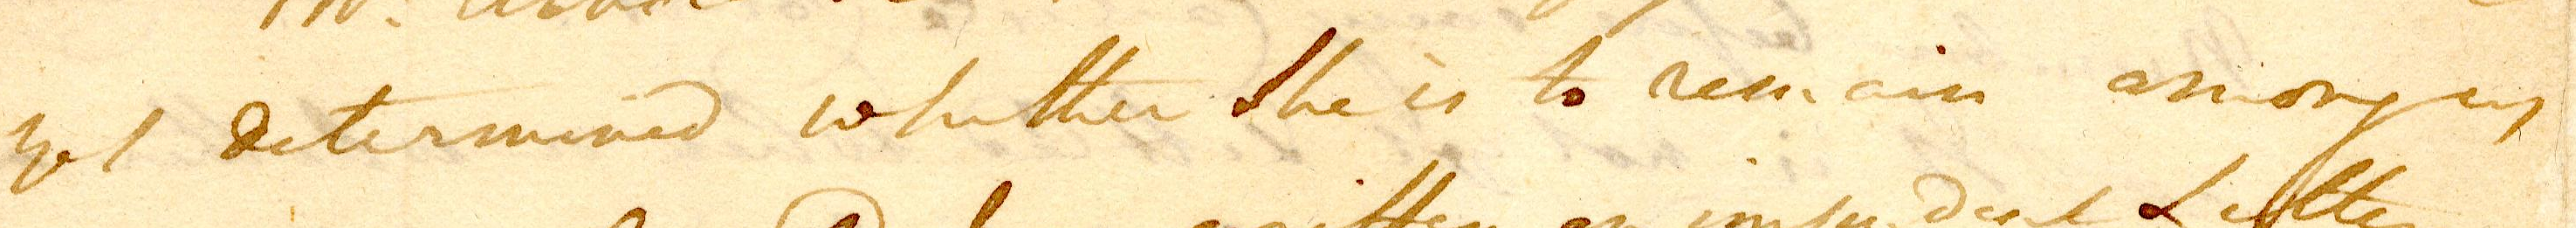yet determined whether she is to remain among us
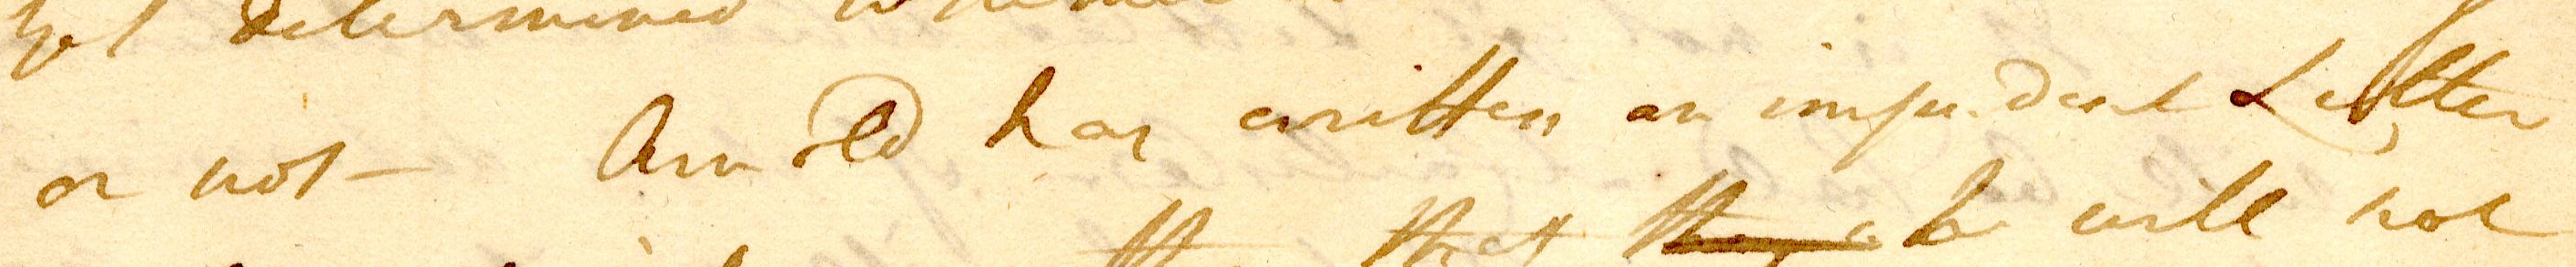or not. Arnold has written an impudent Letter
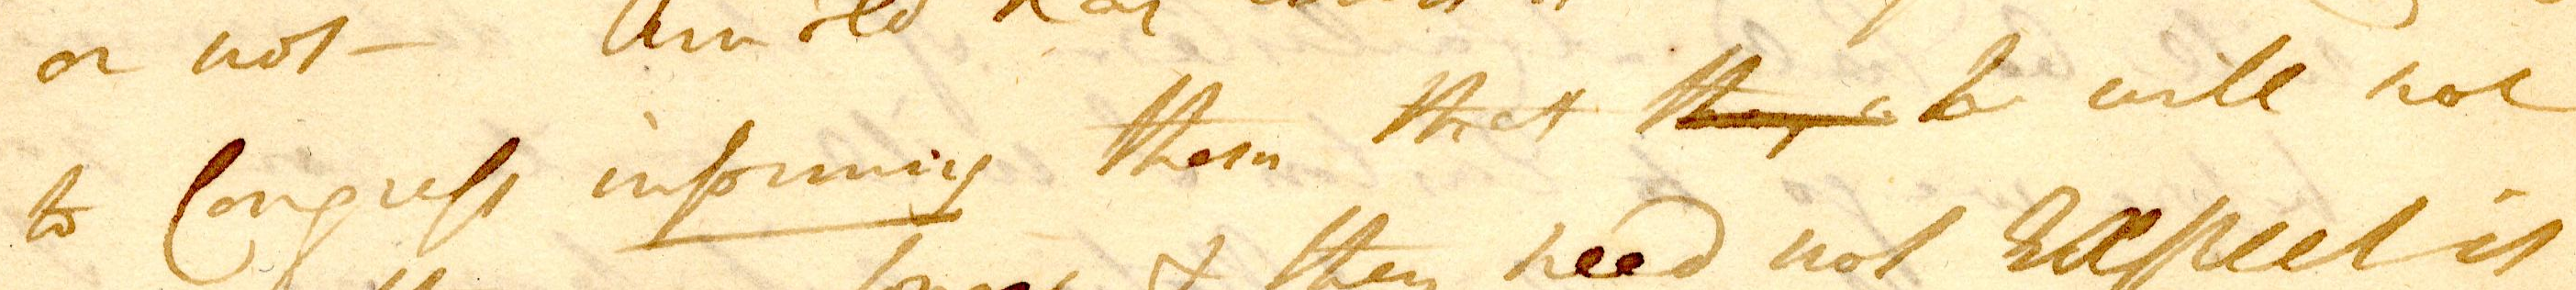to Congress informing them that they I will not
